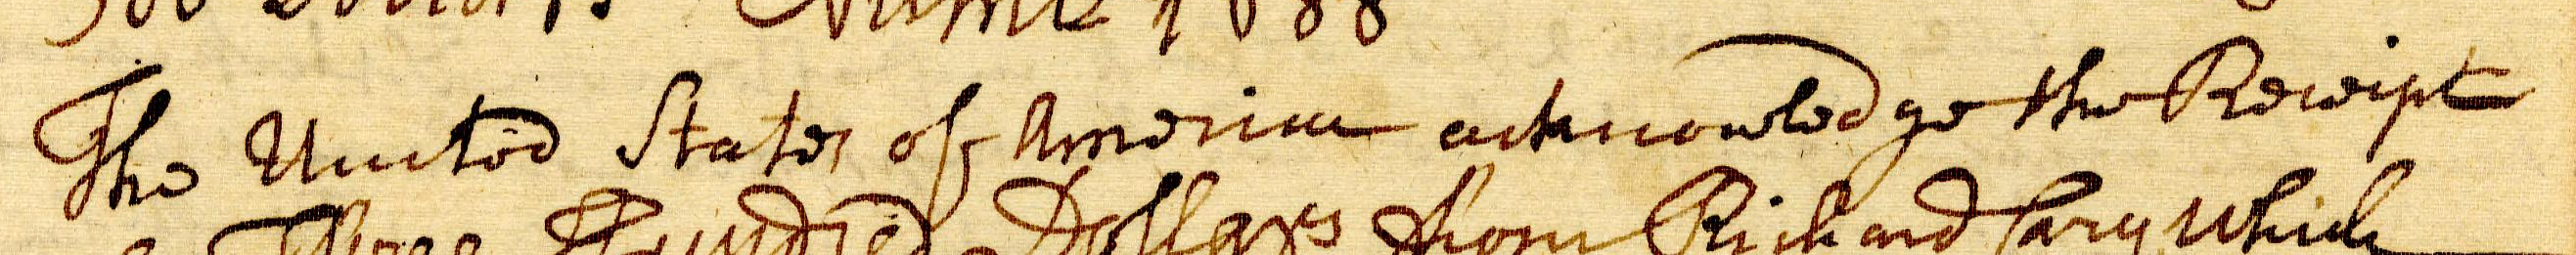The United States of America acknowledge the Receipt
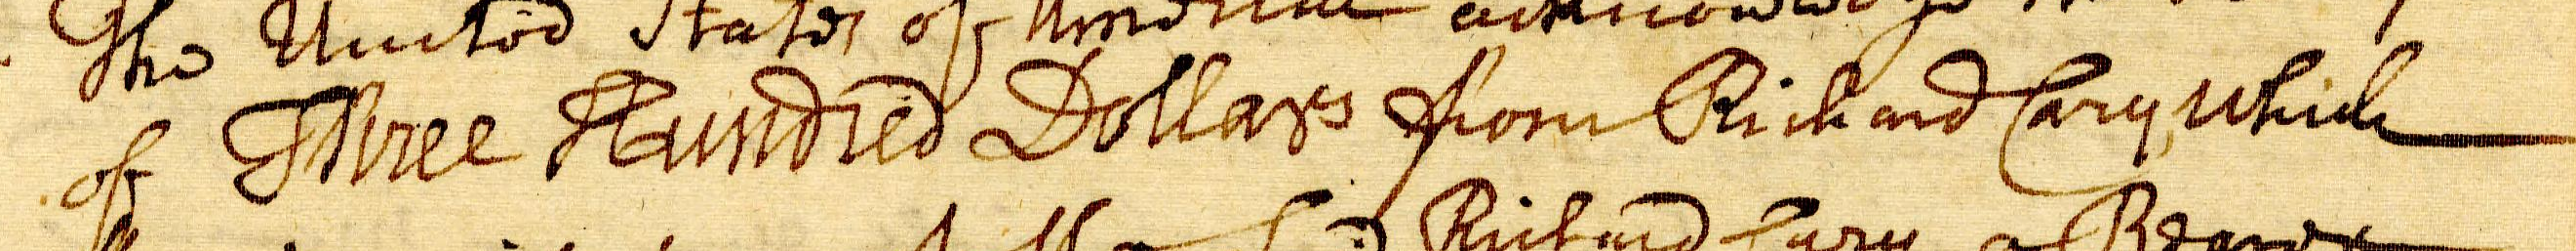of Three Hundred Dollars from Richard Cary Which
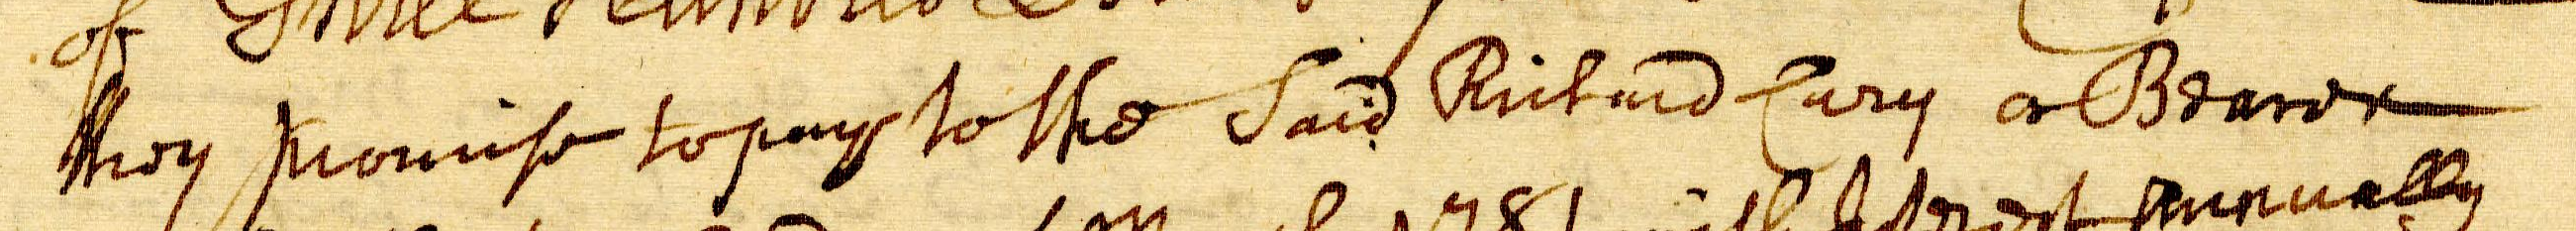they promise to pay to the said Richard Cary a Board
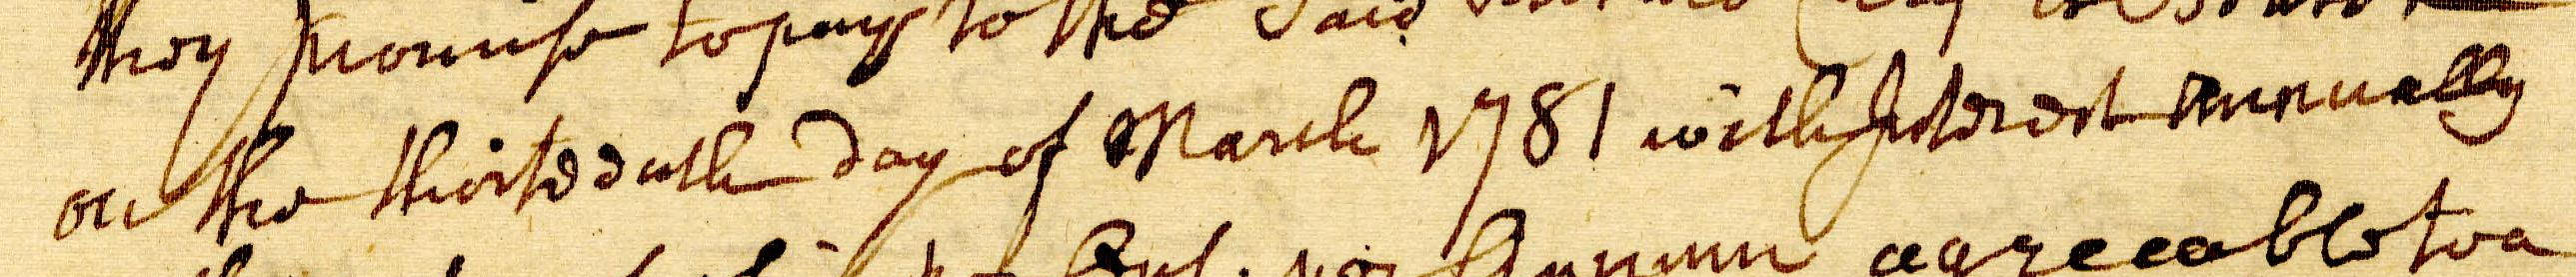on the thirteenth day of March 1781 with Interest Annually
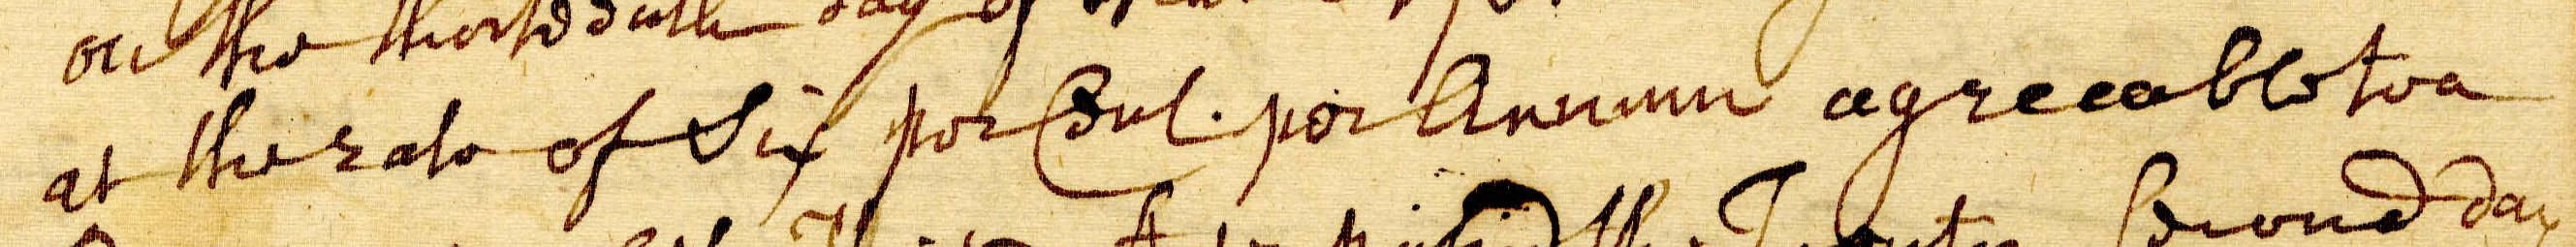at the rate of Six per Cent per Annum agreeable to a
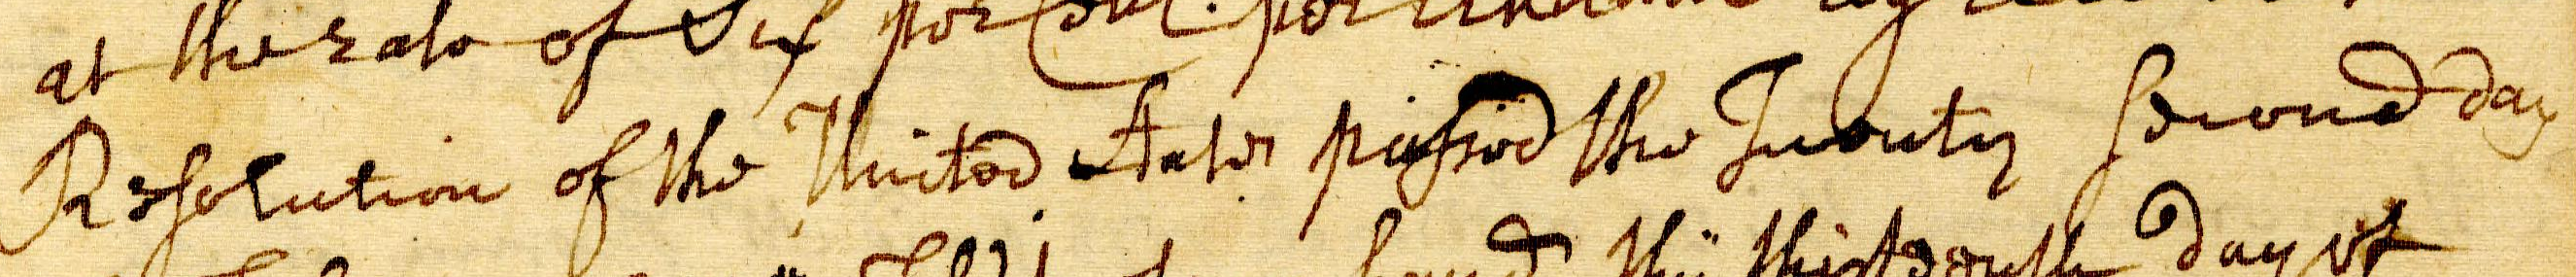Resolution of the Thirteen States passed the Twenty second day
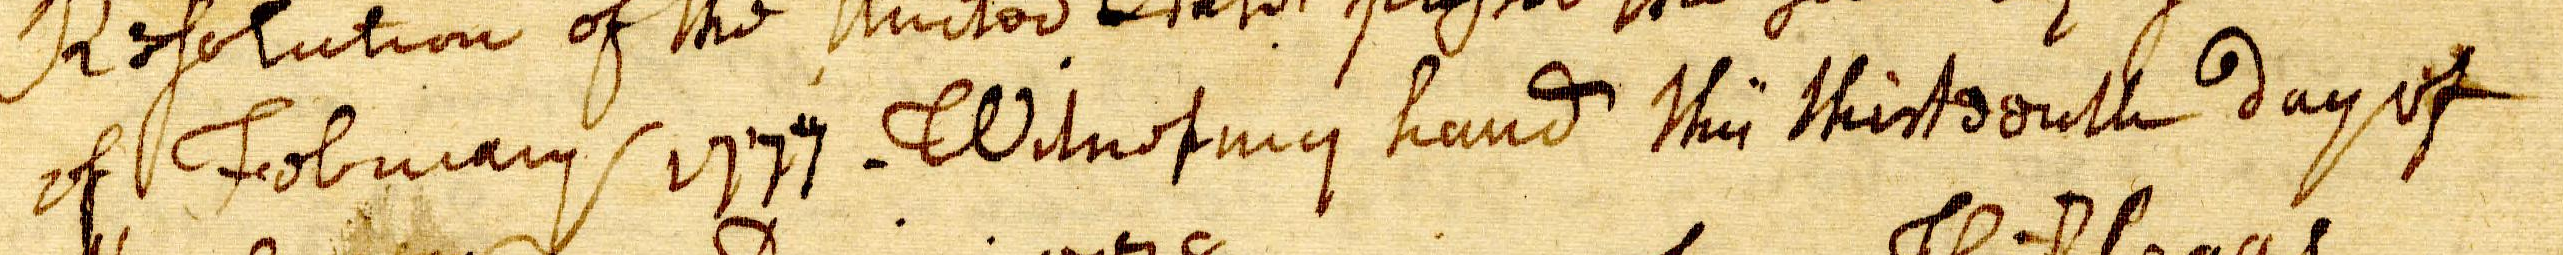of February 1777- Witness my hand this thirteenth day of
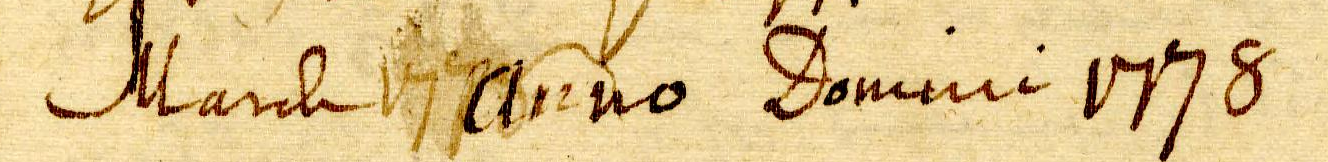March & Anno Domini 1778
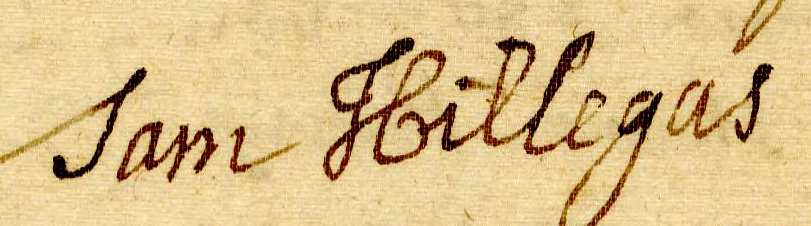Sam Hillegas
